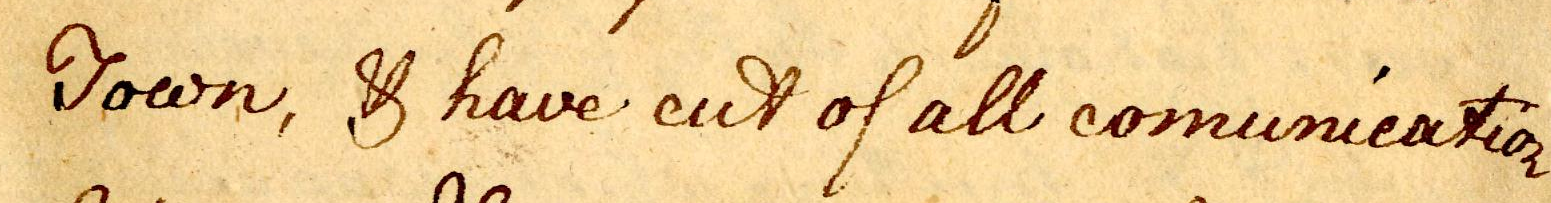Town, & have cut of all communication
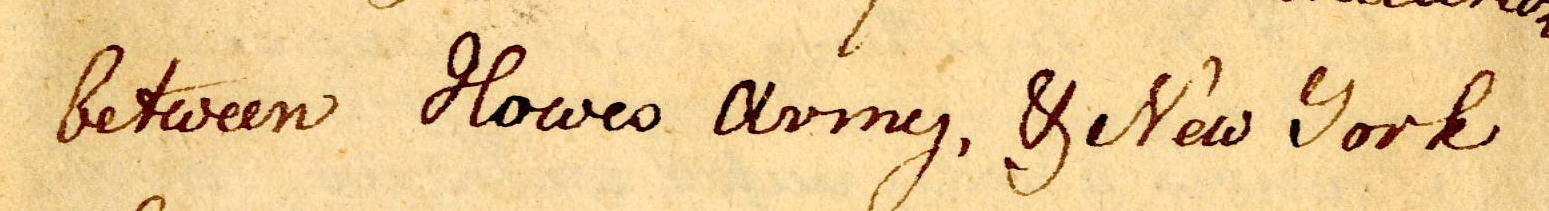between Howes Army, & New York
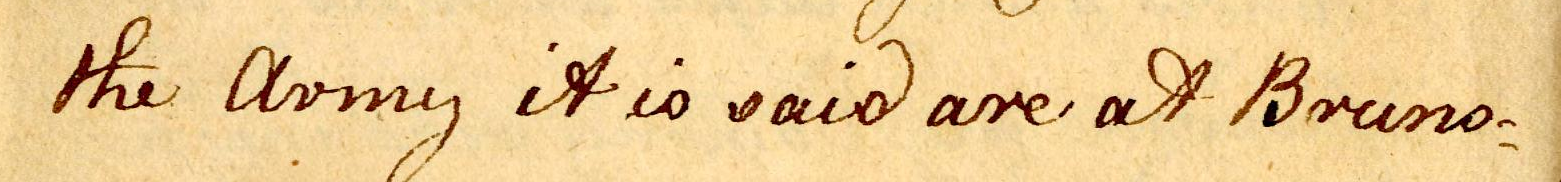the Army it is said are at Bruns-
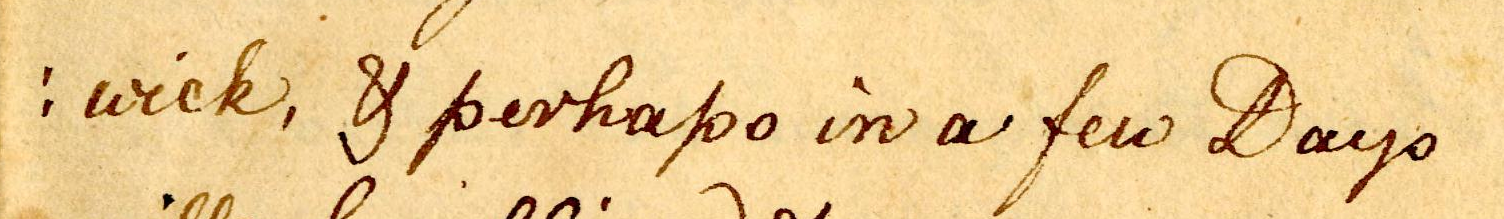-wick, & perhaps in a few Day s
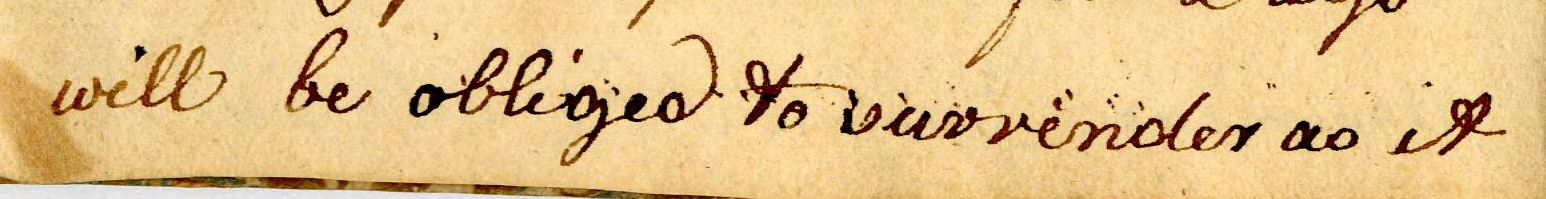will be obliged to surrender as it
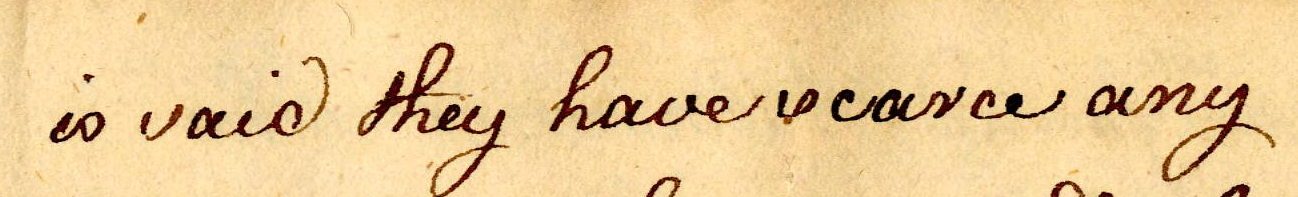is said they have scarce any
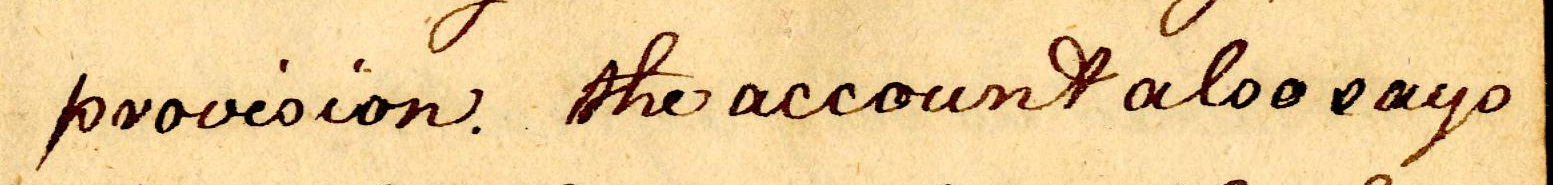provision. the account also says
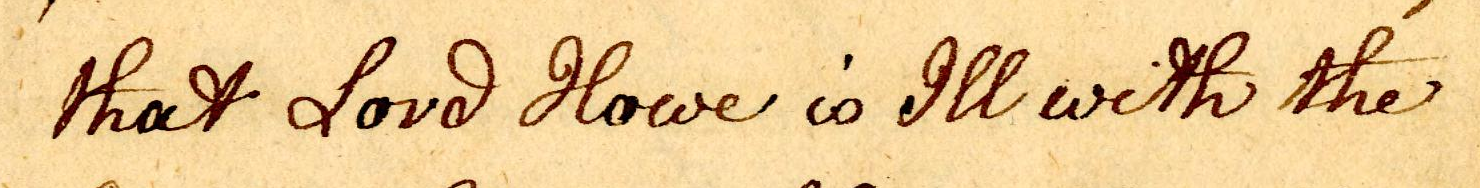that Lord Howe is Ill with the
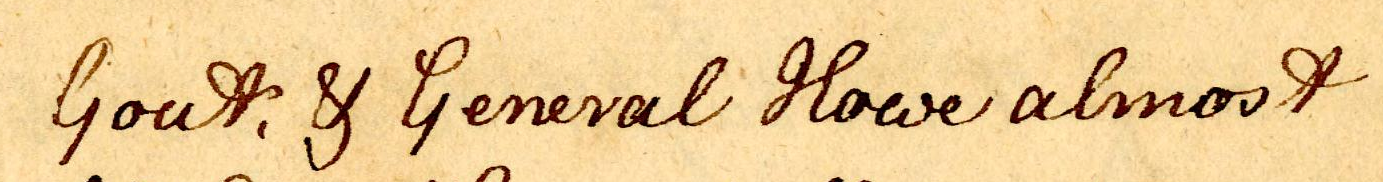Gout, & General Howe almost
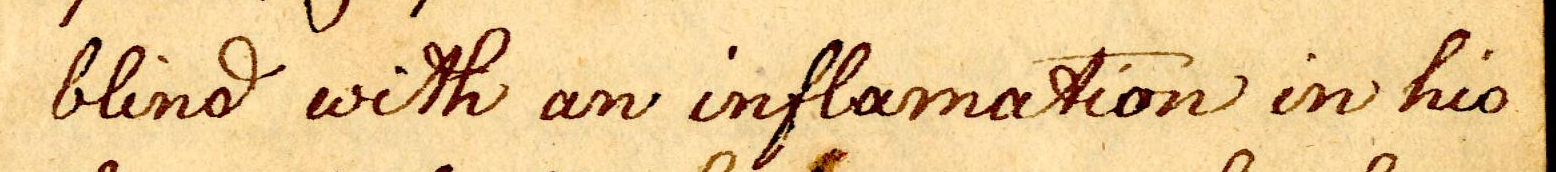blind with an inflamation in his
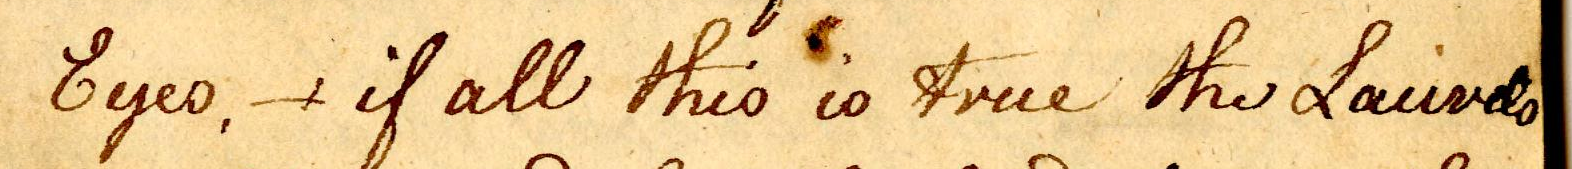Eyes.- if all this is true the Laurels
